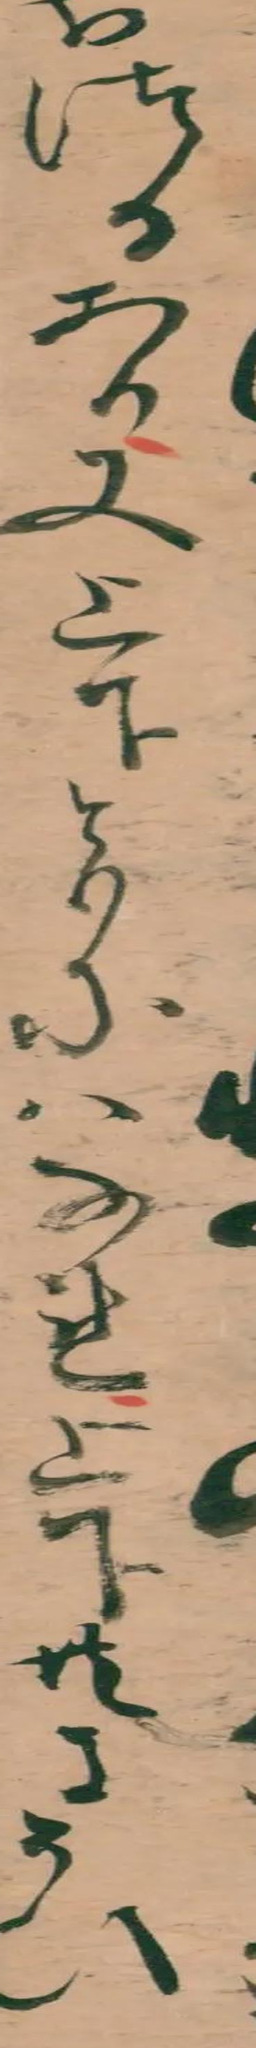おつるあり又上下ともにハなれ上下共にそひ
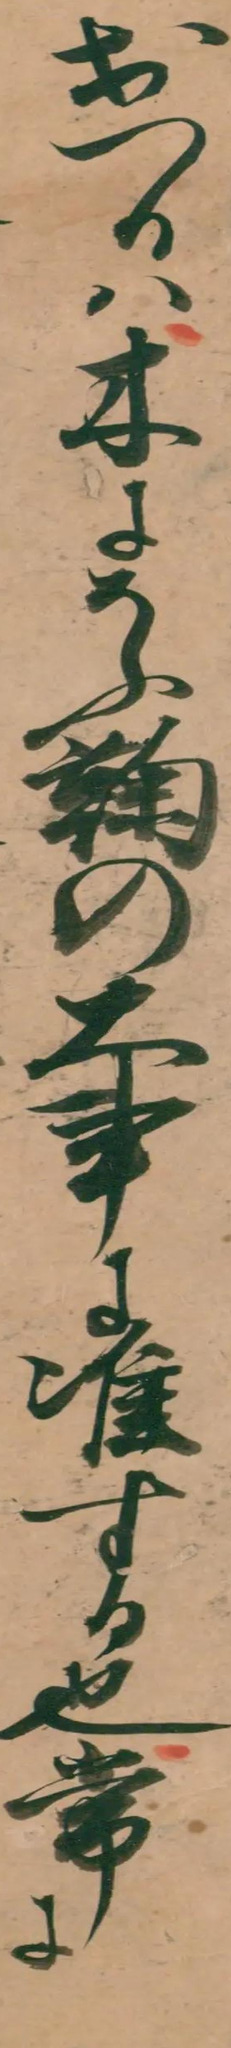おつるハ木にそふ鞠の大事に准する也常に
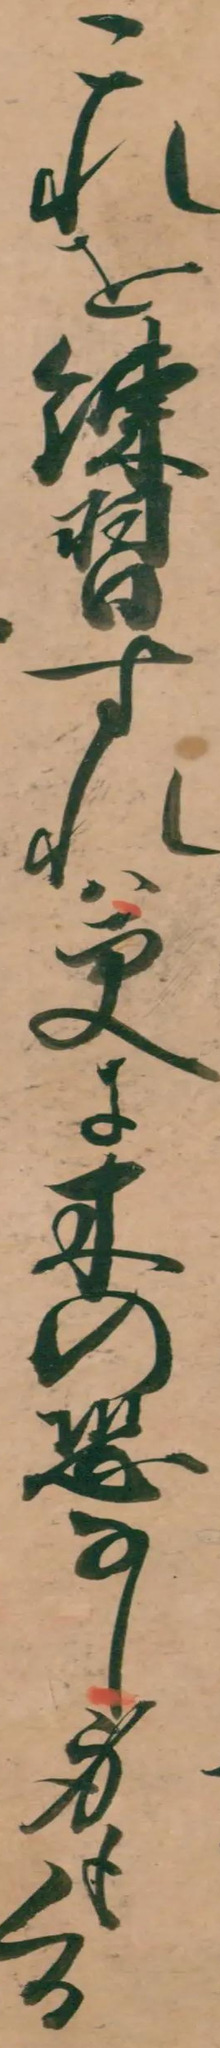これを練習すれハ更に木の恐なし身もくる
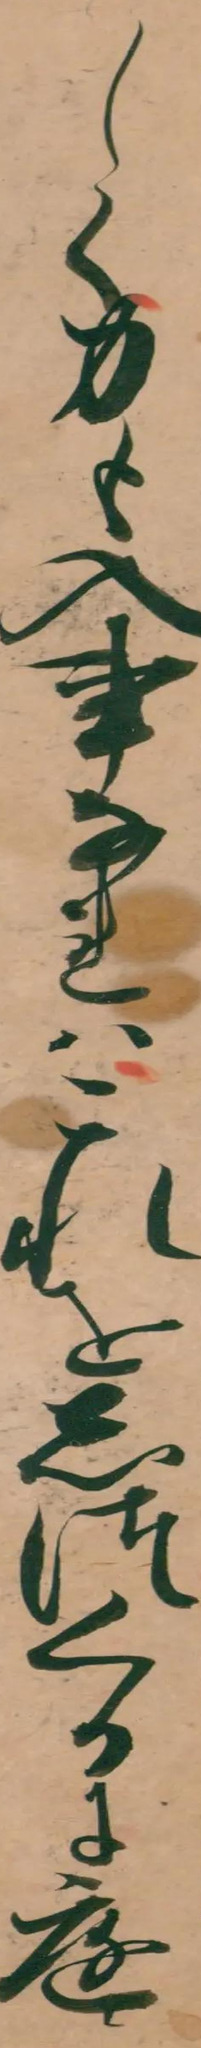しく力も入事なれハこれをしつくるに庭
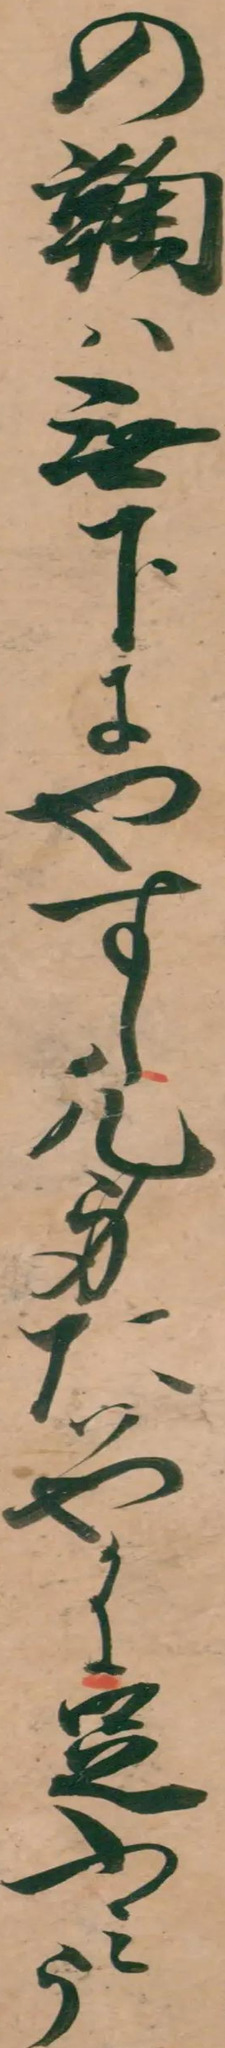の鞠ハ無下にやすし凡身たハやかに足ふミう
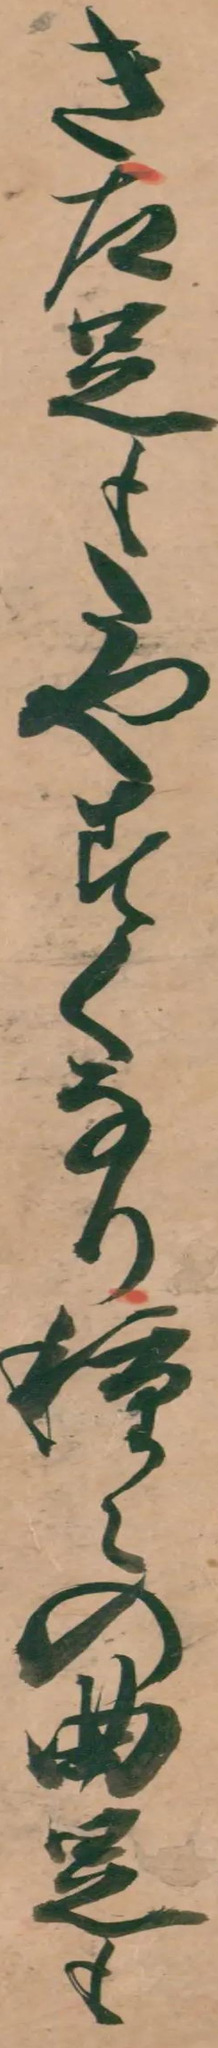き左足もたやすくなり種々の曲足も
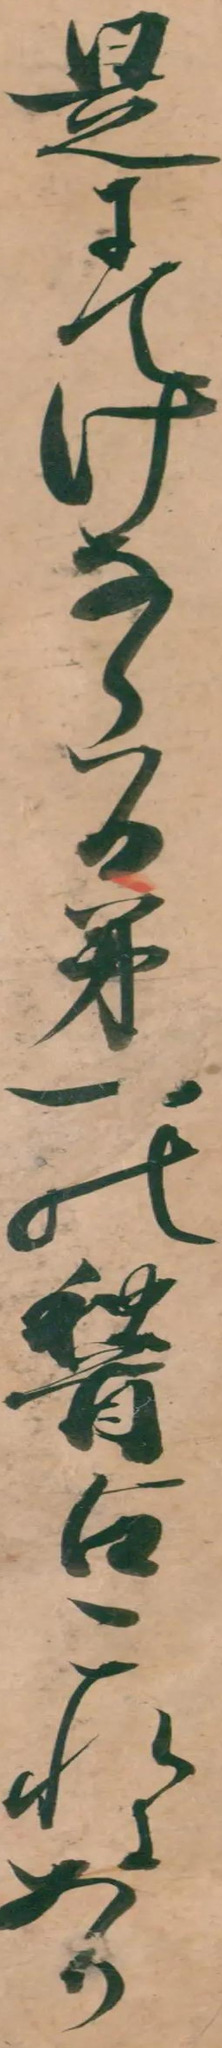是にてけならハる第一の稽古これにあり
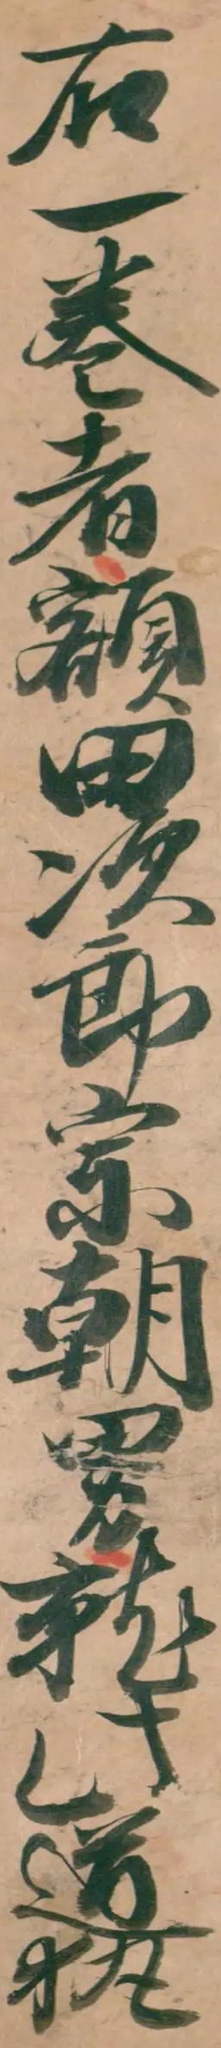右一巻者額田次郎宗朝男就此道執
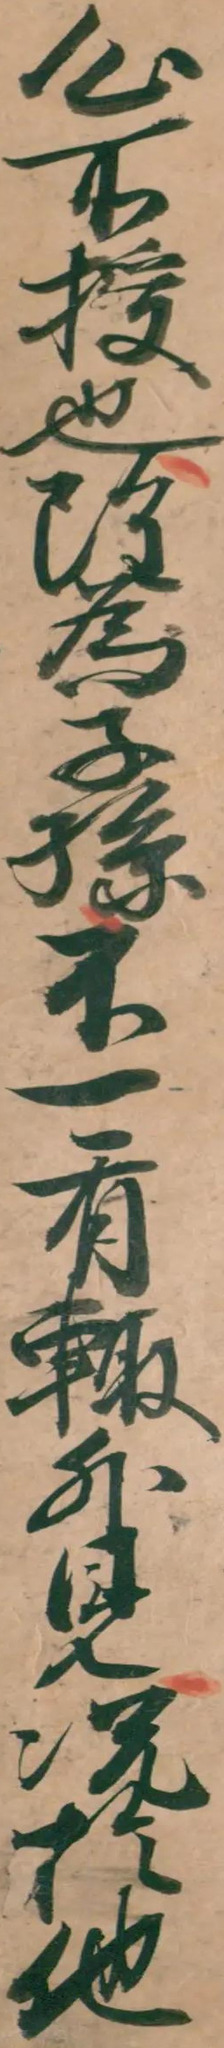心所授也改為子孫不可有輒外見況於他
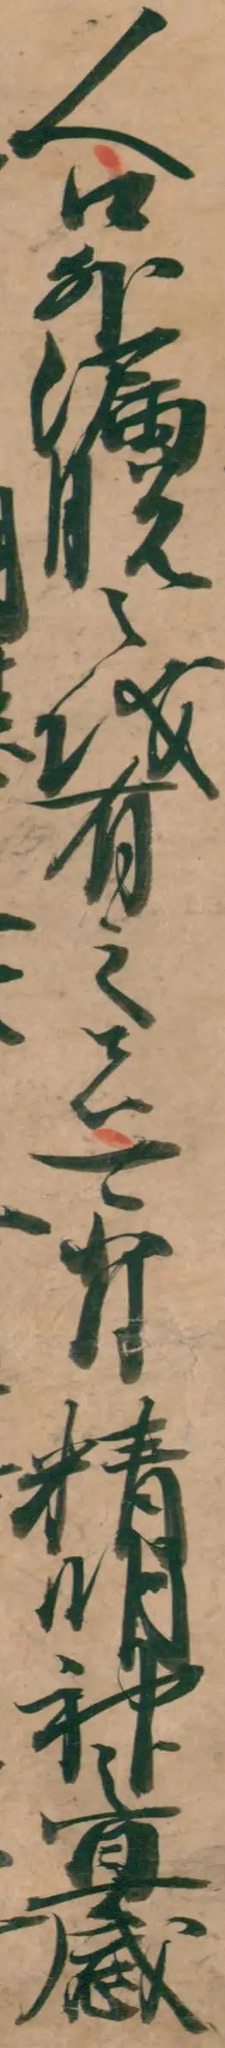人口外漏脱之儀有之者可背精明神冥感
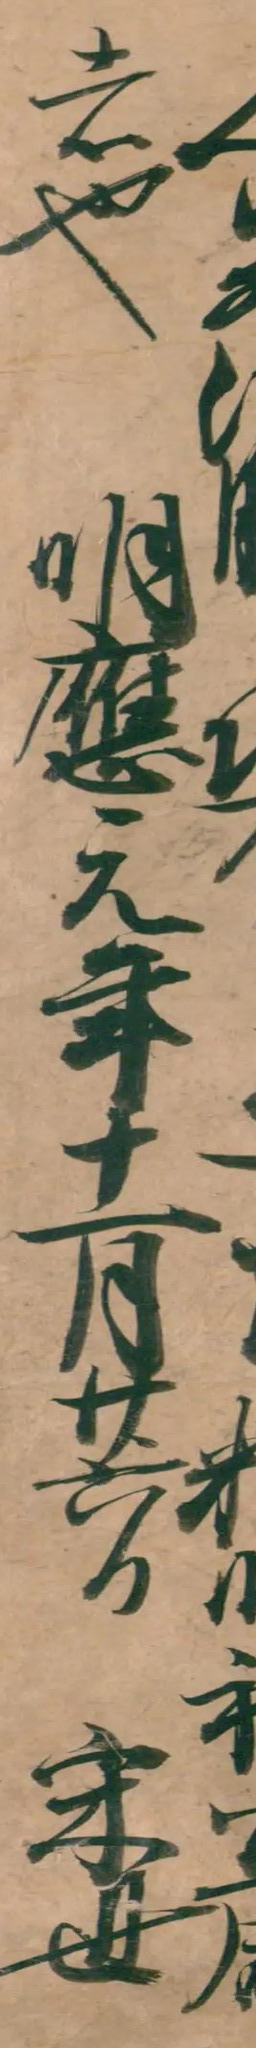者也明応元年十一月廿六日末世
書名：蹴鞠之条々大概
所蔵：国立国会図書館 National Diet Library, JAPAN
